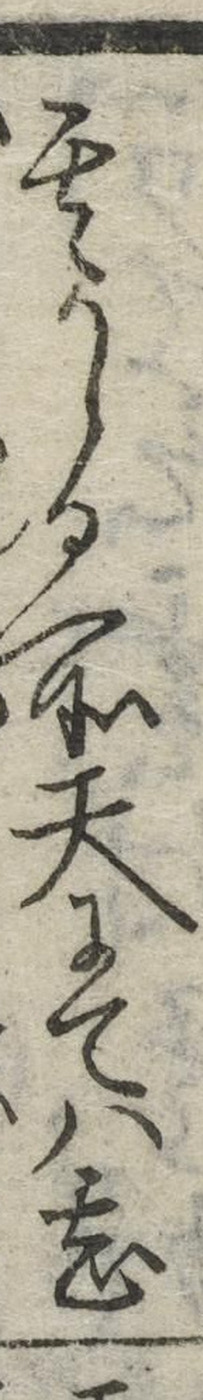其かゝる所天にては甚
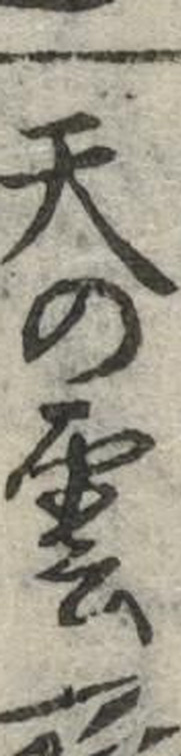天の雲
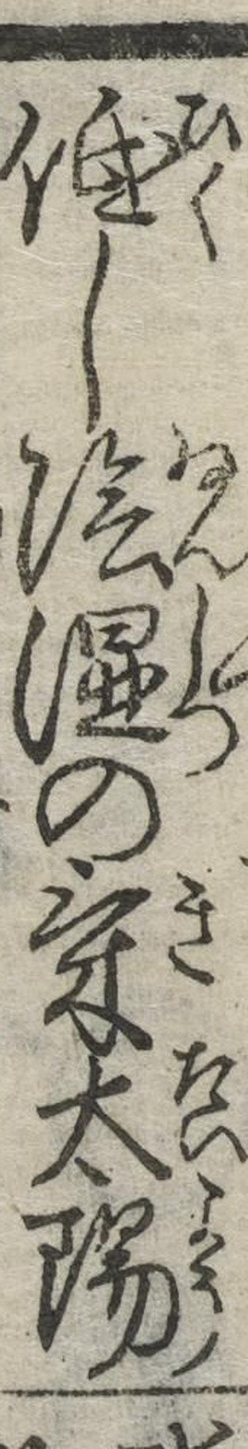低し陰湿の気太陽
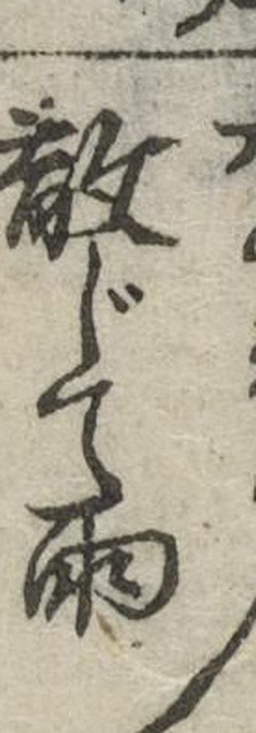散じて雨
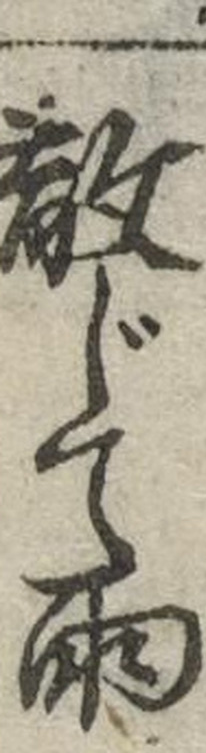散じて雨
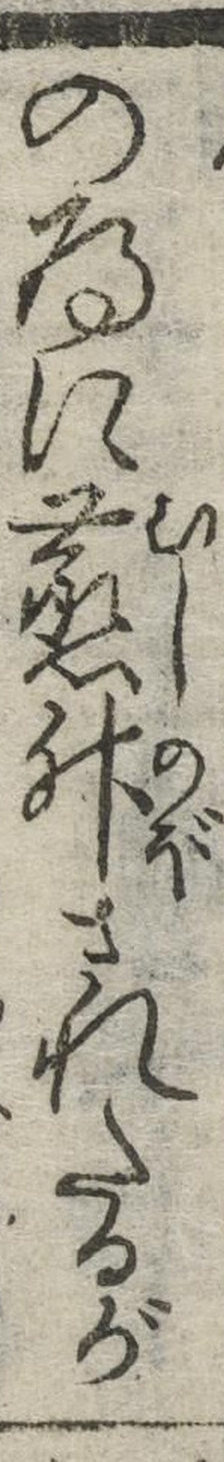の為に蒸升されたるが
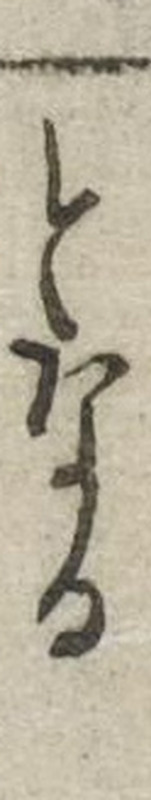となる
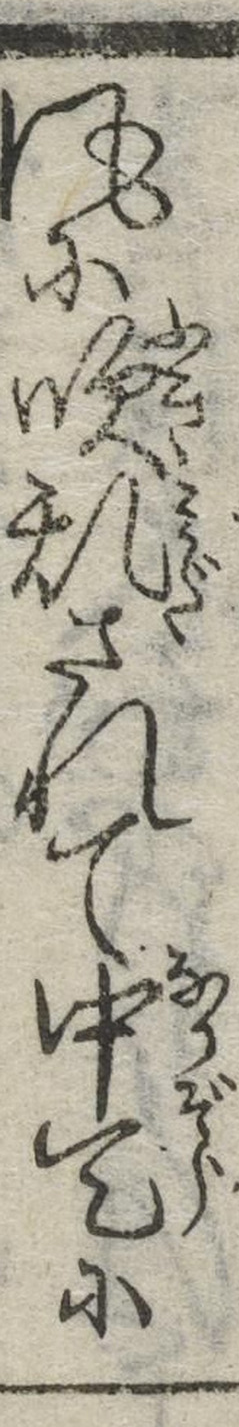風に吹乱されて中天に
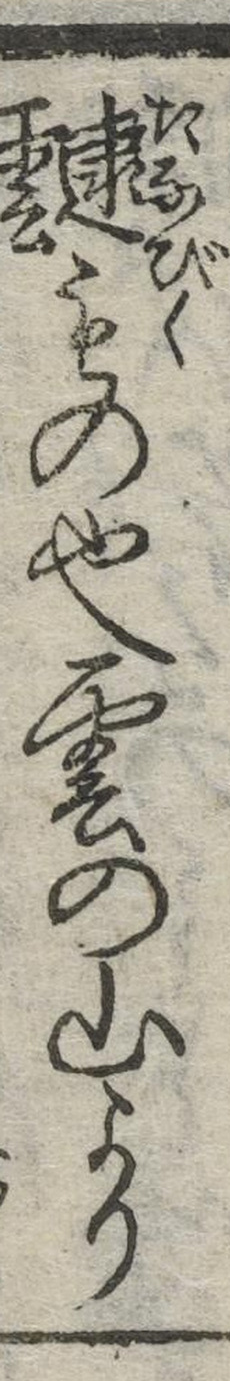靆もの也雲の山より
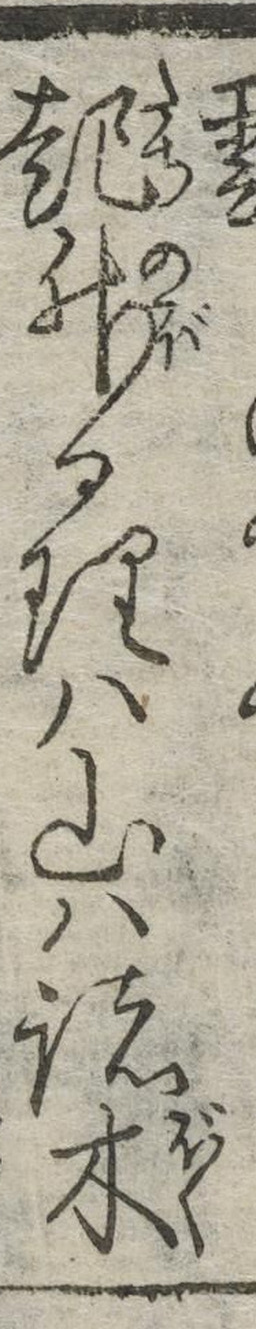起升る理は山は諸木
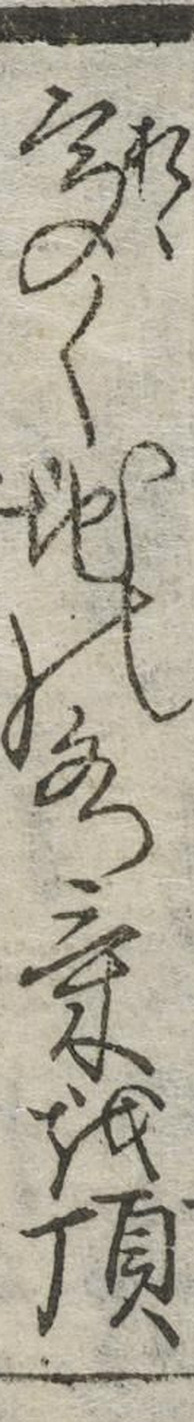多く地の水気を頂
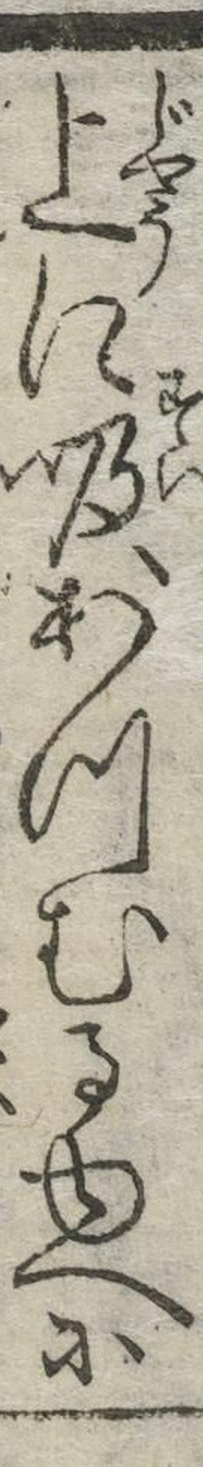上に吸あつむるゆへに
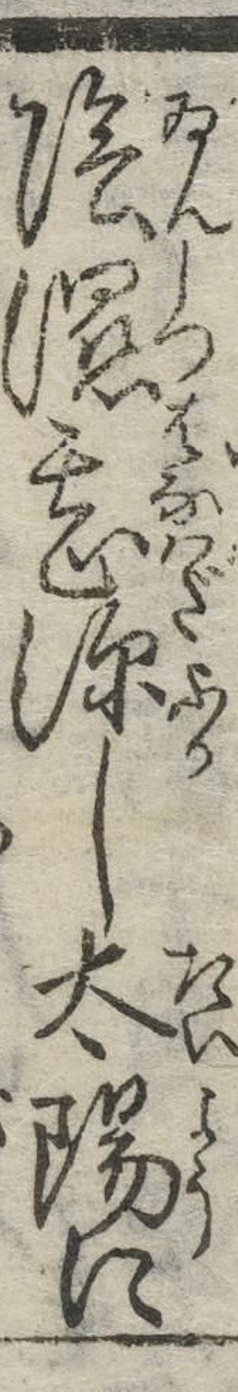陰湿甚深し太陽に
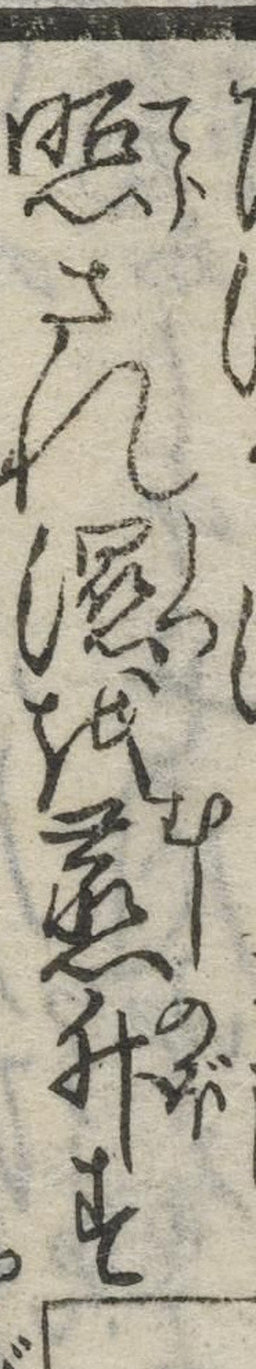照され湿を蒸升す
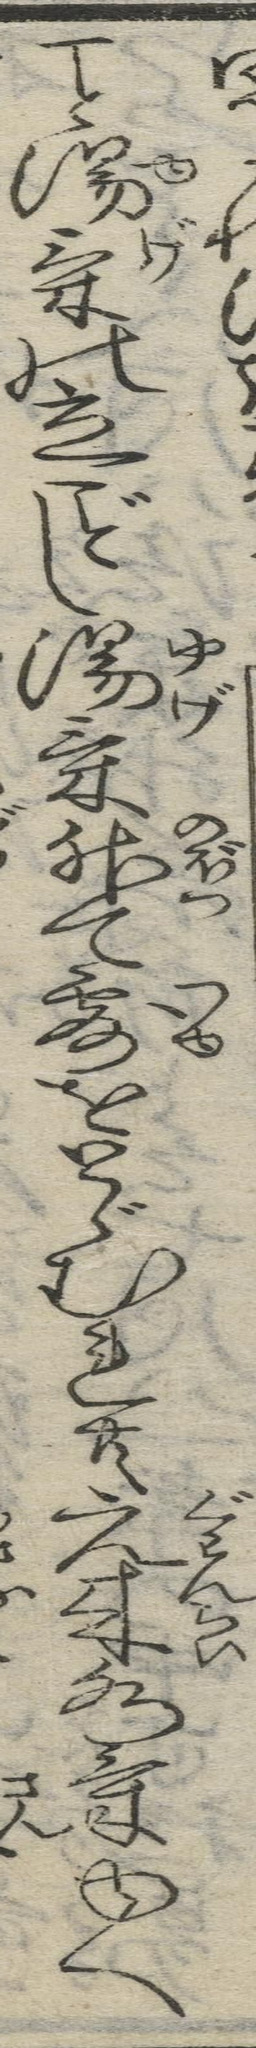こと湯気の立ごとし湯気升て露をとゞむれ共元来水気ゆへ
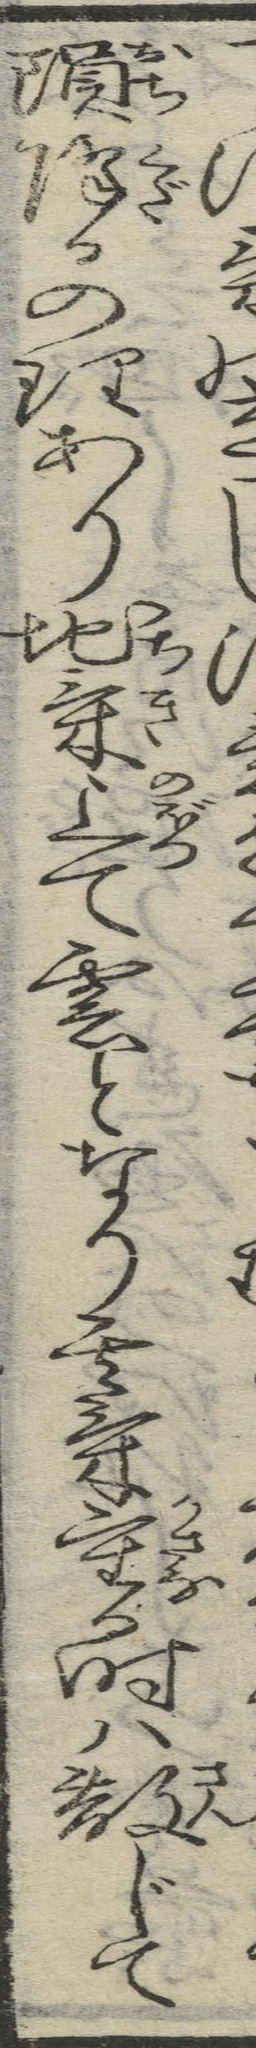隕降るの理あり地気上て雲となり其気重る時は散じて
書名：訓蒙天地辨　地
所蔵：東京大学地震研究所図書室 Earthquake Research Institute Library, The University of Tokyo, JAPAN
